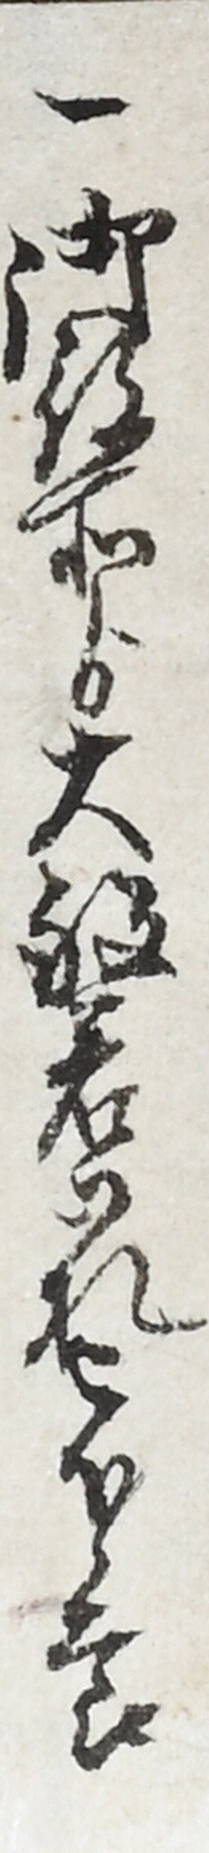一御役所より大納君御礼被下候節
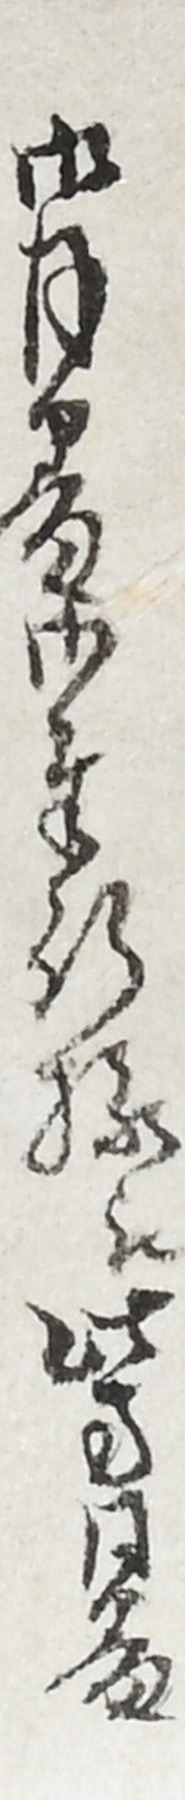御月番御奉行様江此方月番
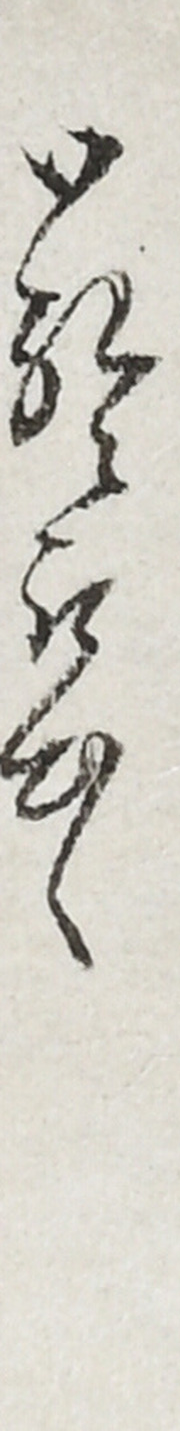御礼ニ被出候
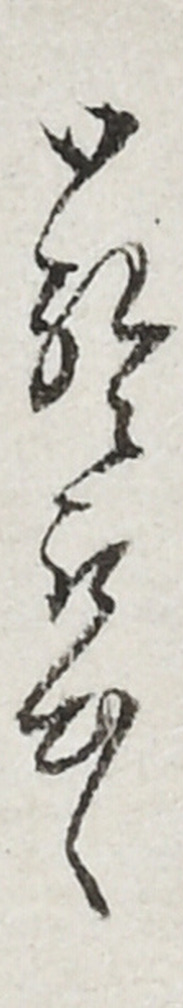御礼ニ被出候
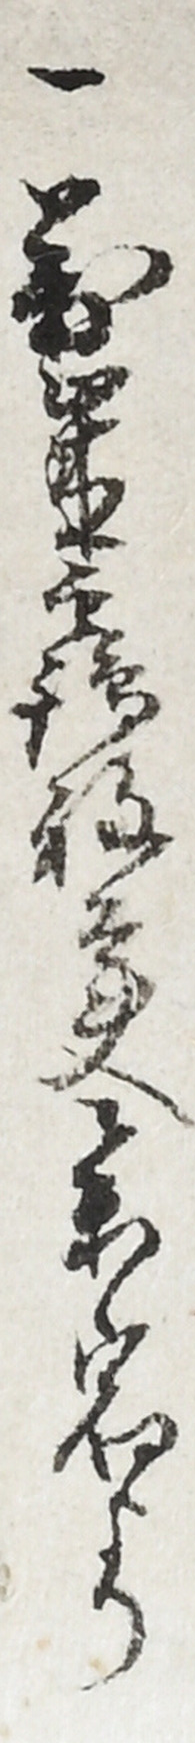一万歳兵衛様太夫桑宿より
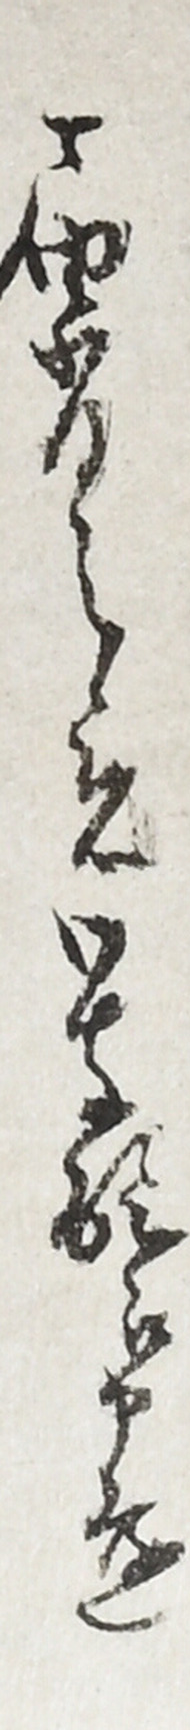届有之候は御支配被申置
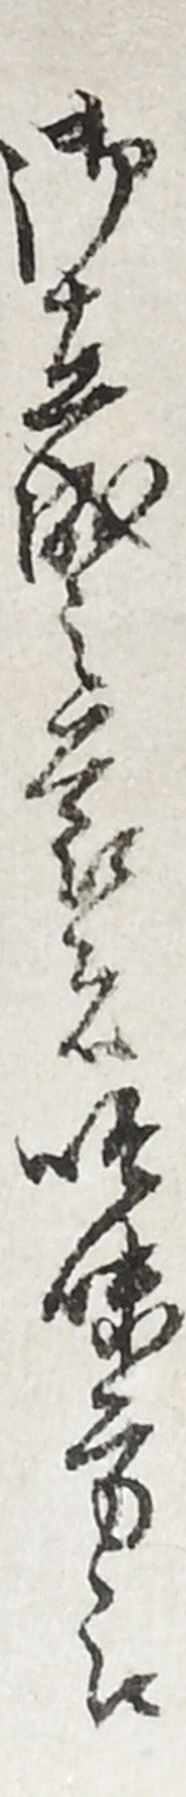御立城之節は吟味方江
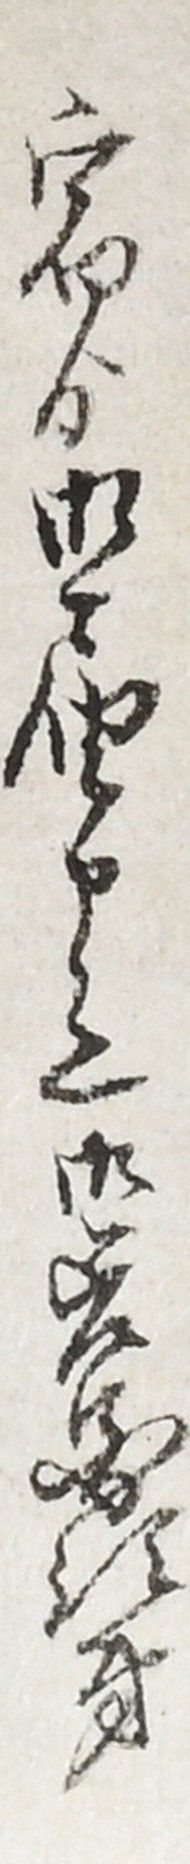宿より御届申上御差図次第
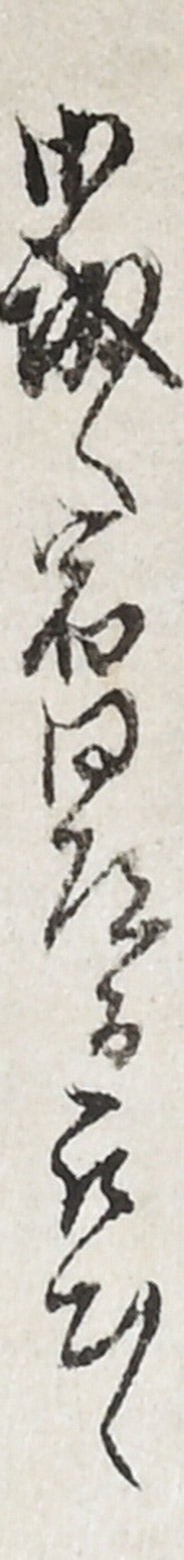御城へ宿同道而罷出候
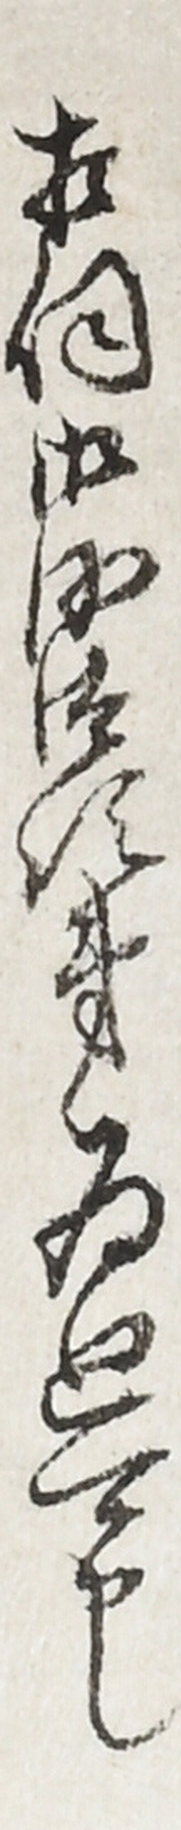相伺御沙汰次第為廻可申候
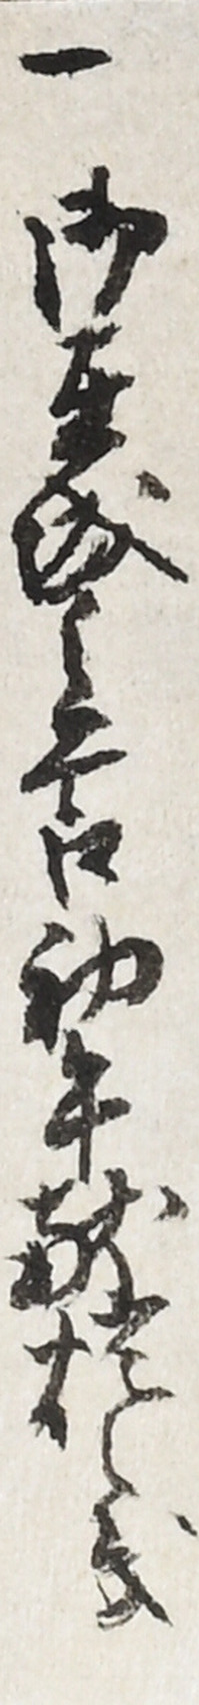一御在城之節初午献灯之義
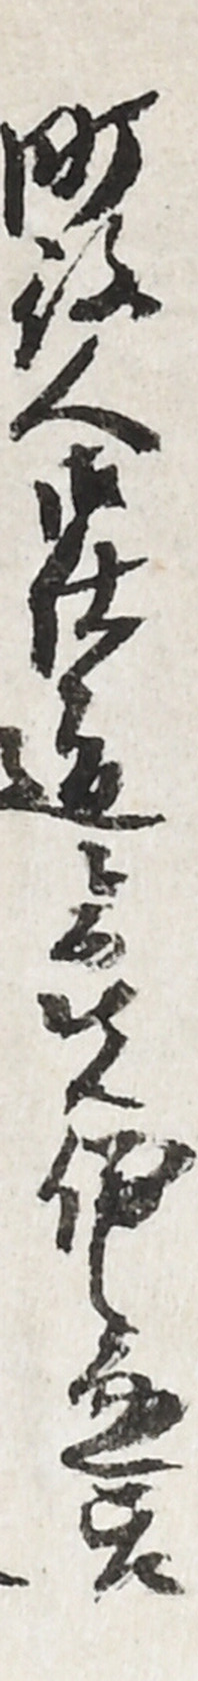町役人御仕道ニ而先例之通差
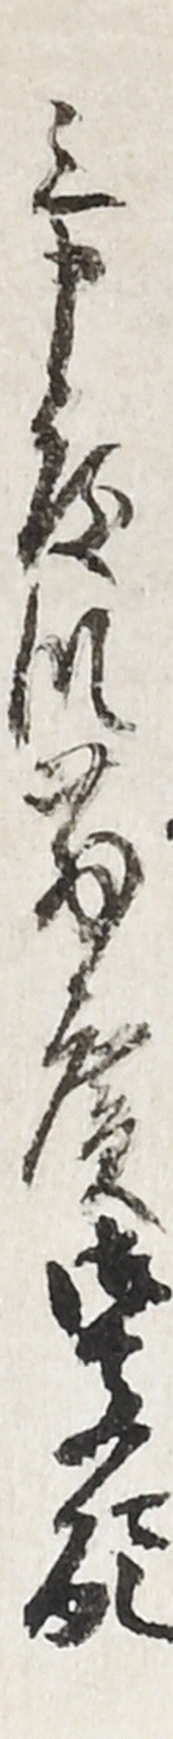上申度似前広御支配
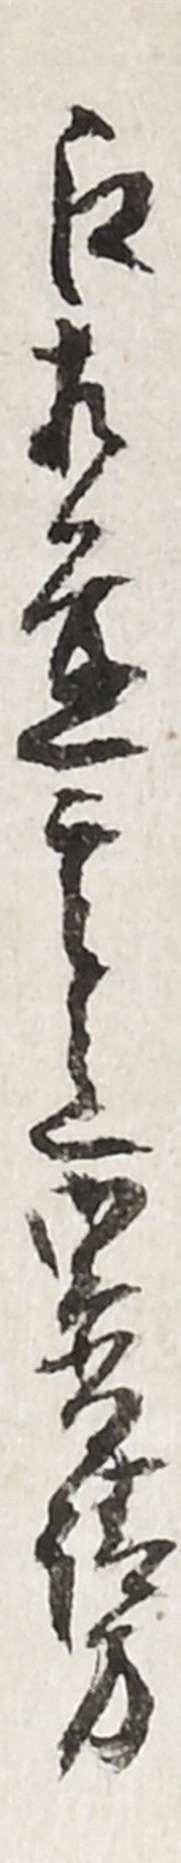江相応其上御普請方
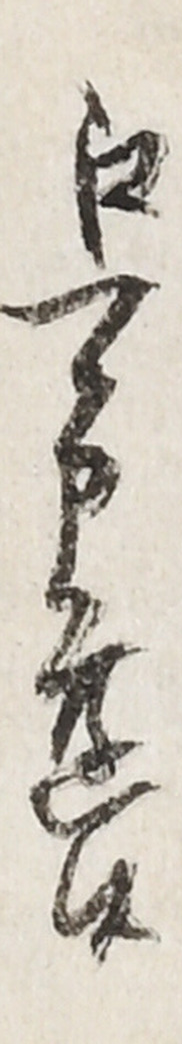江可申達候
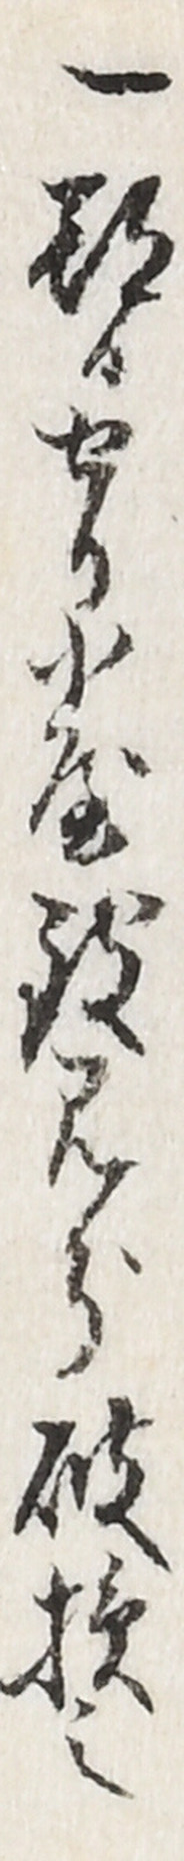一郡日せり小屋致見分破損之
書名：年内行事懐中録
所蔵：伊那市立高遠町図書館・合同会社AMANE
